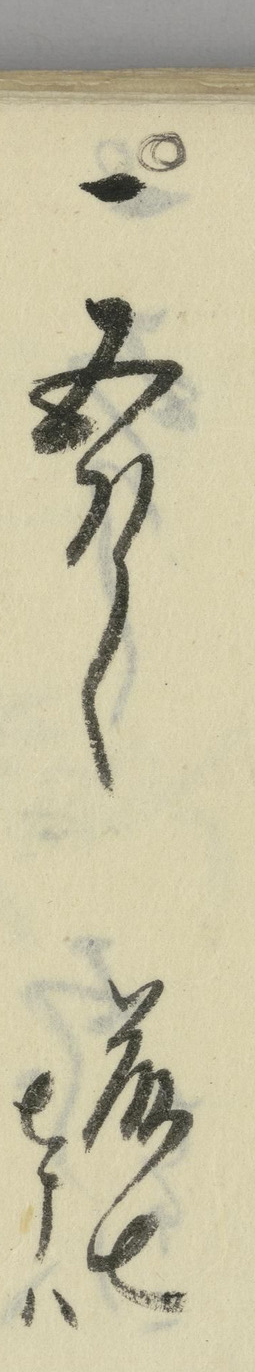一五百文籐七
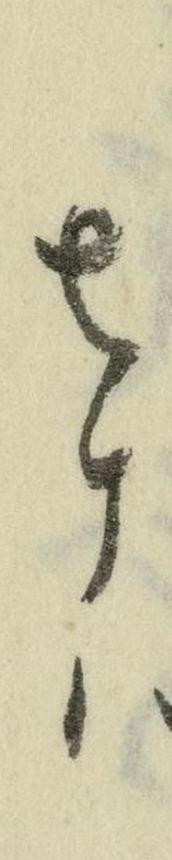七十八
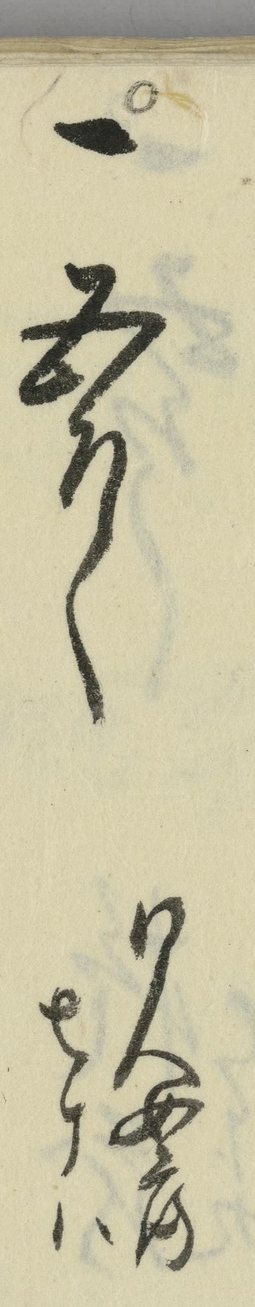一五百文同人女房
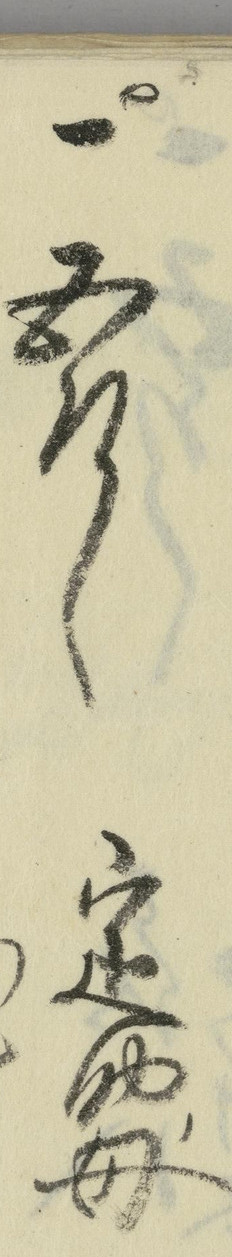一五百文定助母
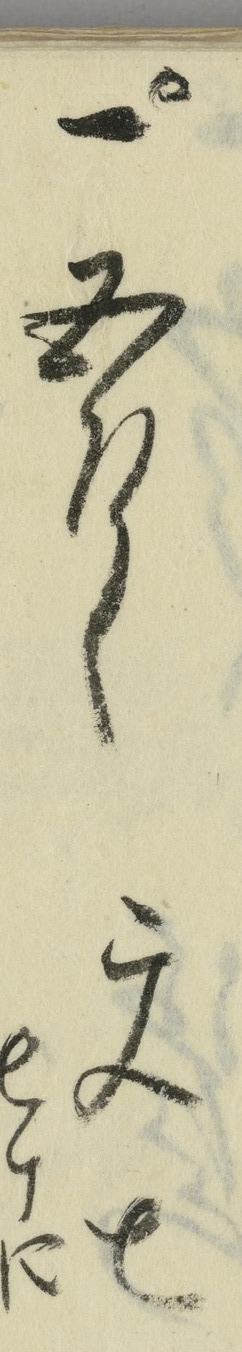一五百文文七
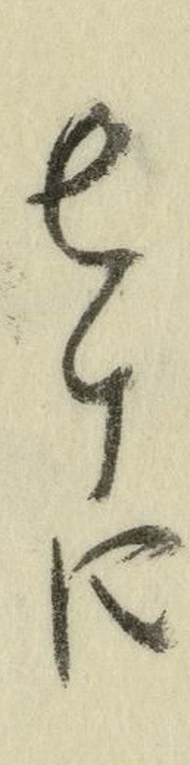七十四
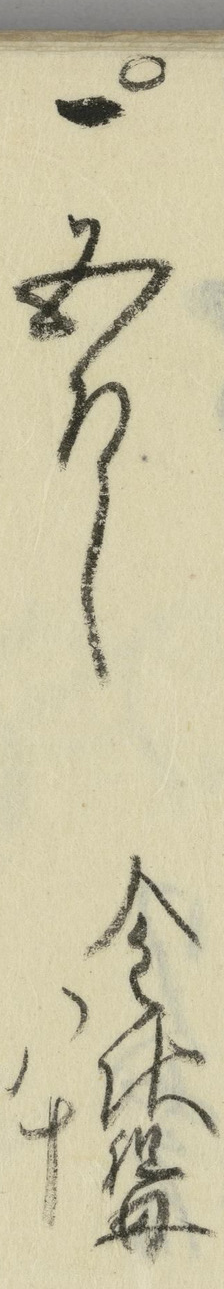一五百文金次祖母
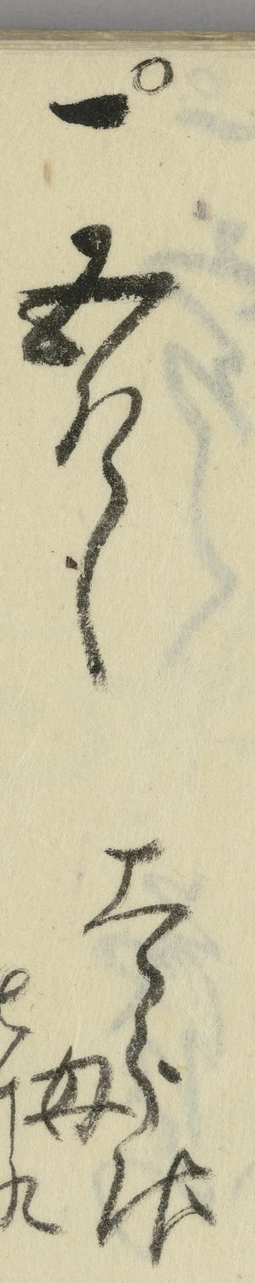一五百文太郎次母
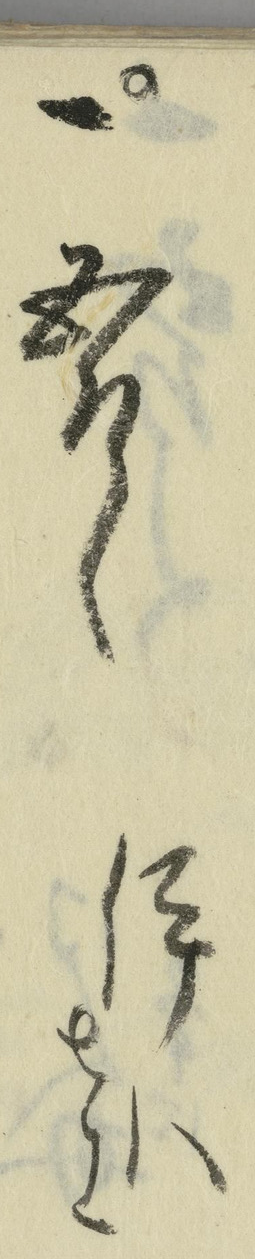一五百文吉左衛門母

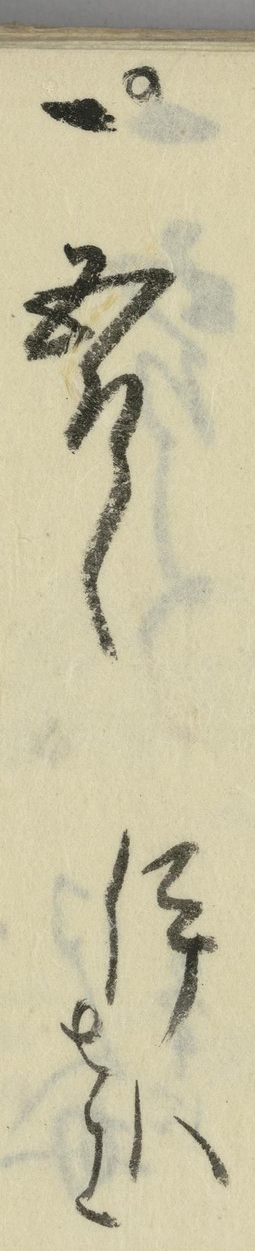一五百文茂兵衛
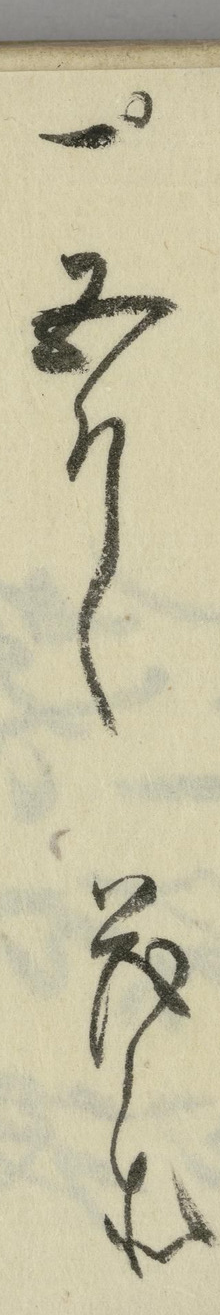一五百文茂兵衛
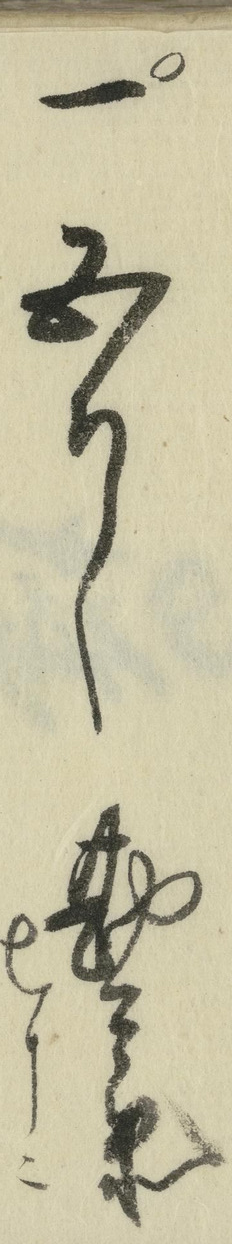一五百文勘兵衛
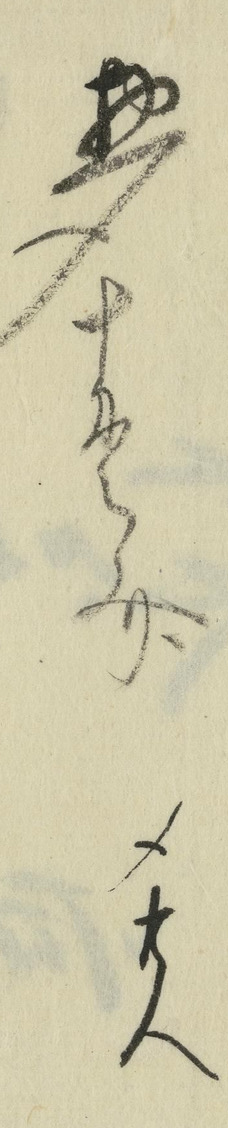惣〆十貫文〆廿人

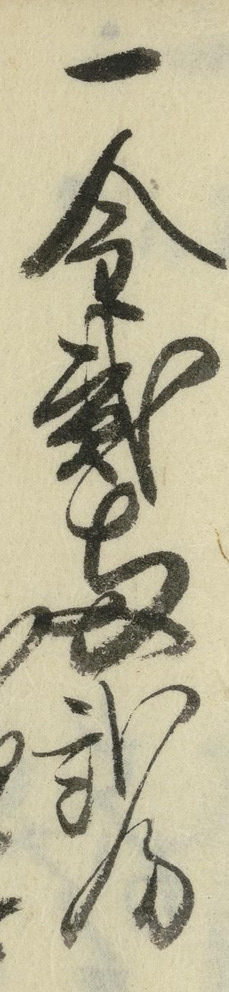一金弐両弐分
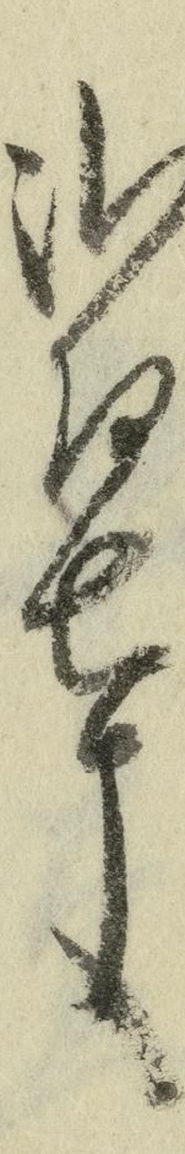弐百七十文
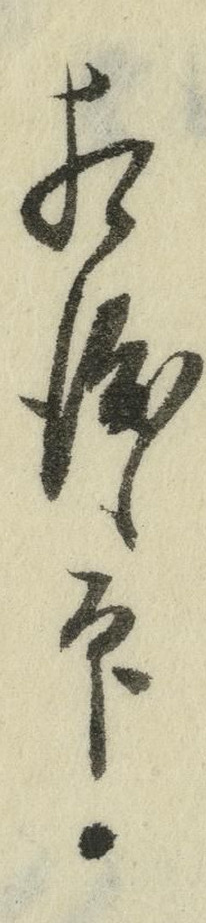相渡候印
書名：天明淺間噴火ニ関スル書類
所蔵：東京大学地震研究所図書室 Earthquake Research Institute Library, The University of Tokyo, JAPAN
